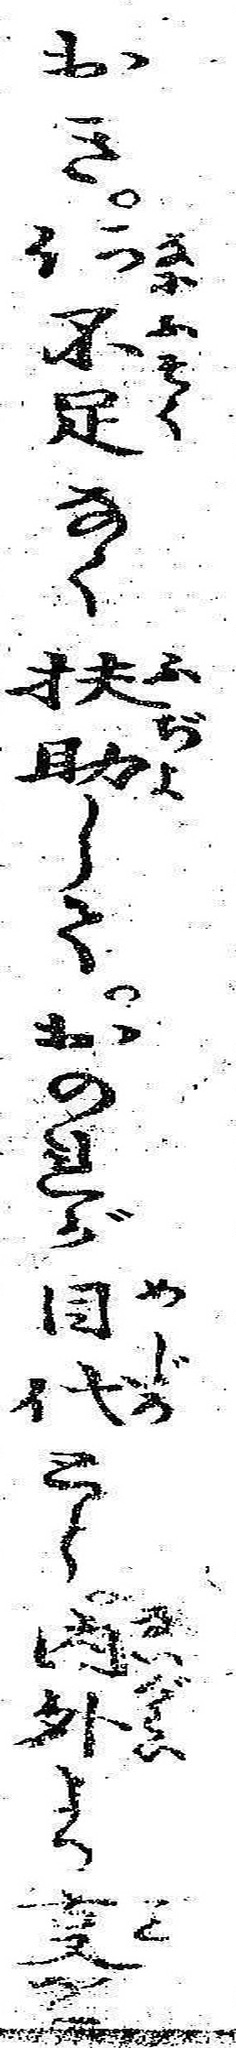おき。何不足なく扶助して。おのれが目代とし。内外より事を
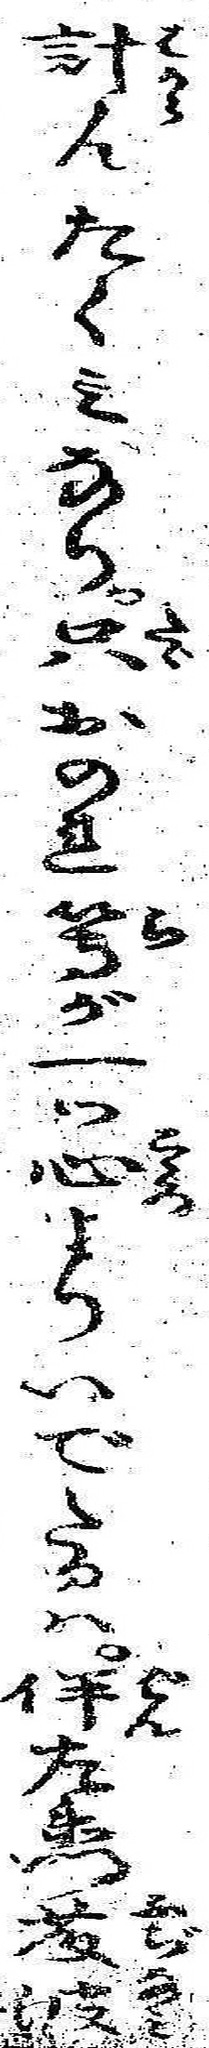計んたくみなり。只おのれ等が一ツ心よりいでたるは。伴左衛門藤波
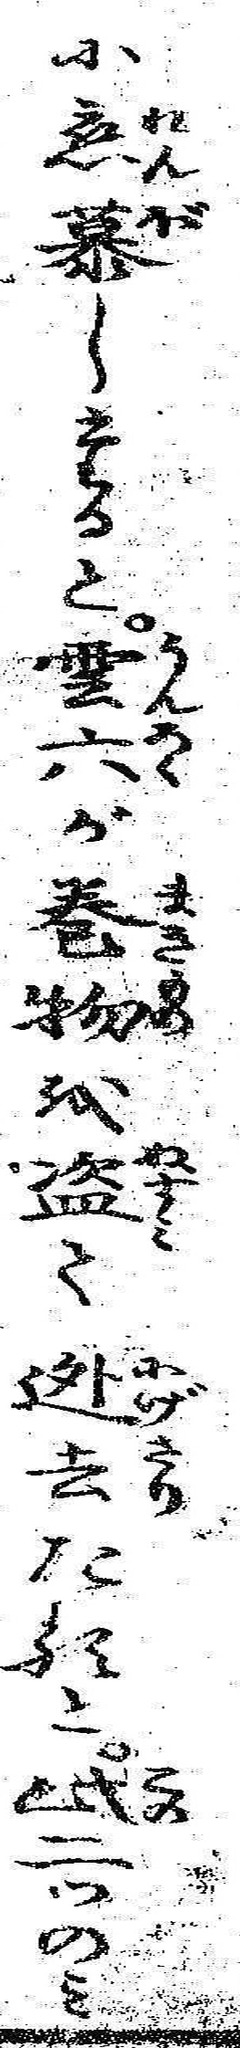に恋慕したると。雲六が巻物を盗て逃去たると。此二ツのみ
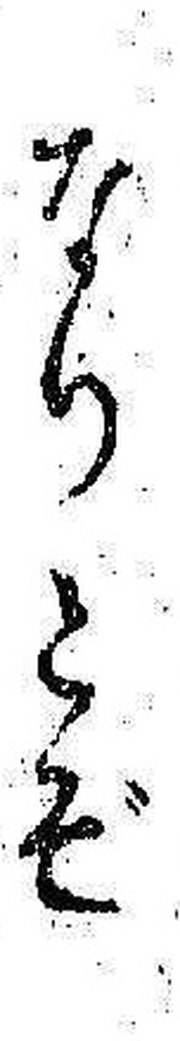なりとぞ

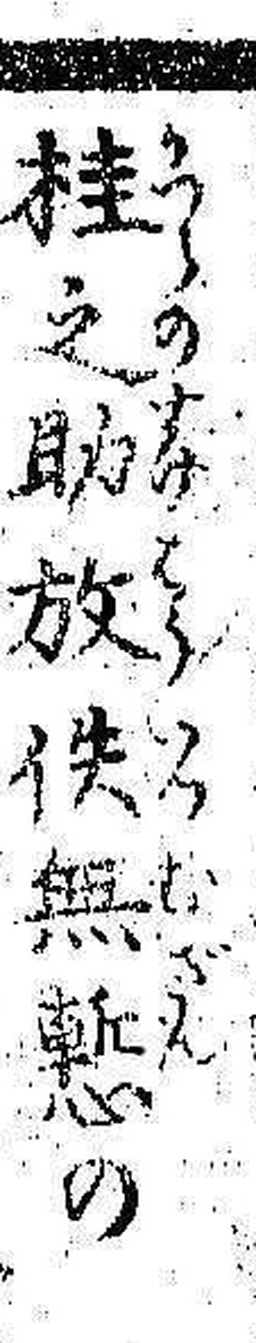桂之助放佚無慙の
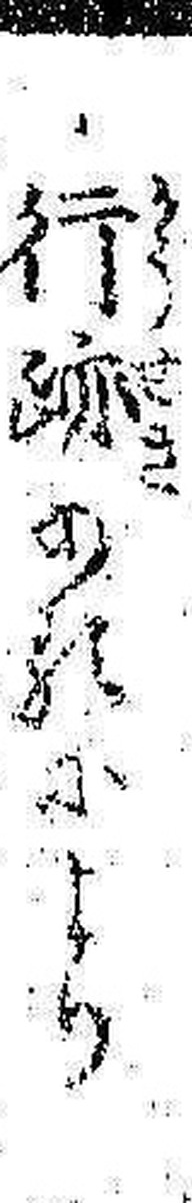行跡あるにより
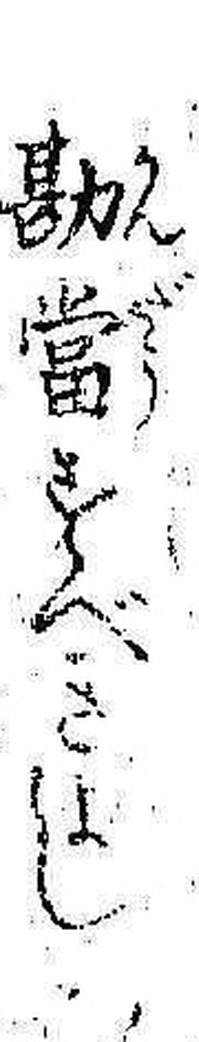勘当すべきよし
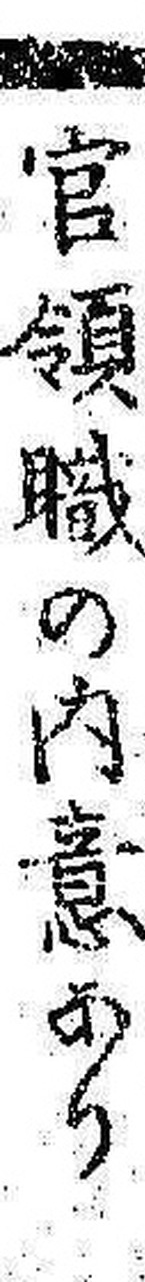官領職の内意あり
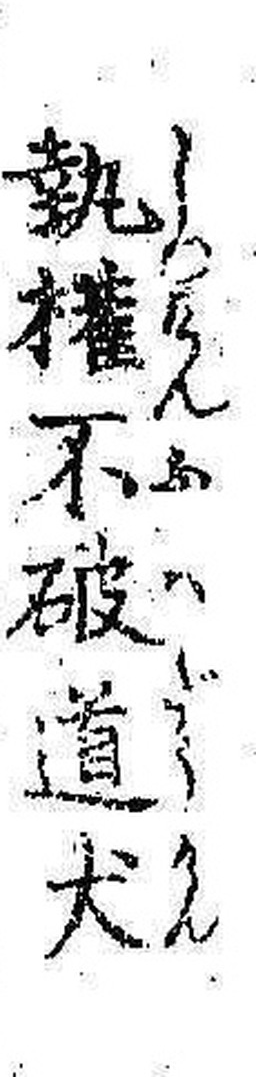執権不破道犬
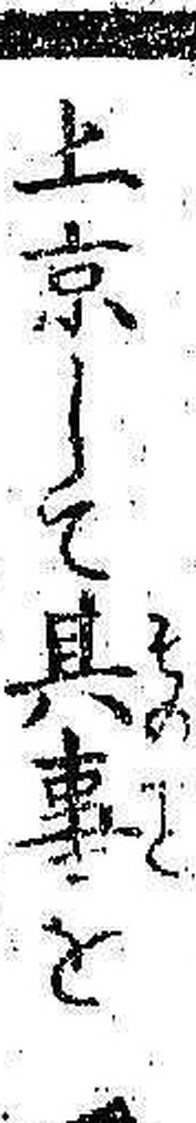上京して其事を
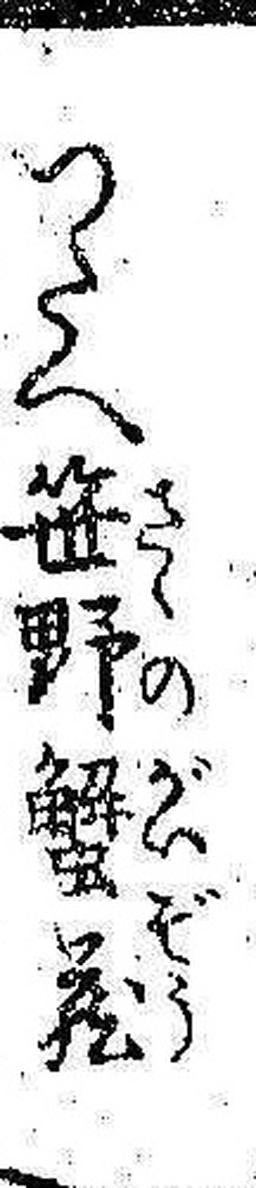つたへ笹野蟹蔵
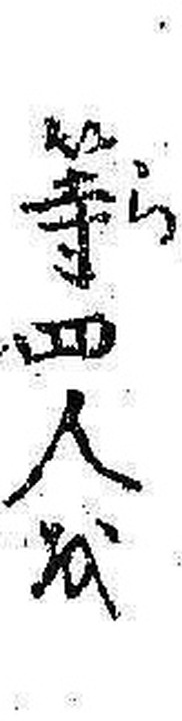等四人を
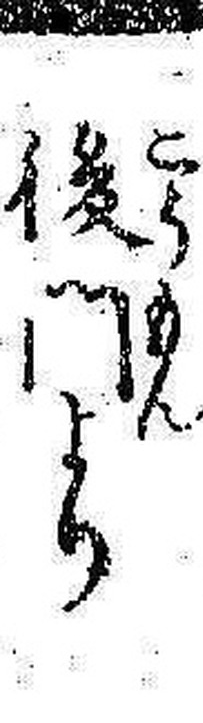後門より
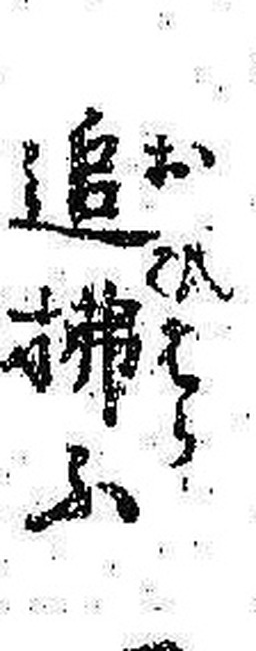追払ふ
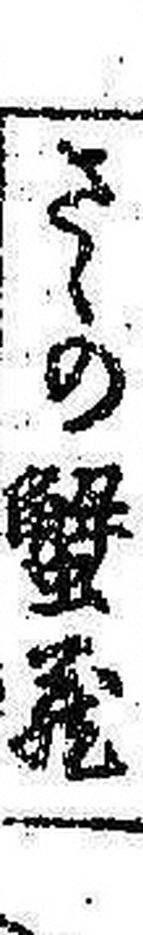さゝの蟹蔵
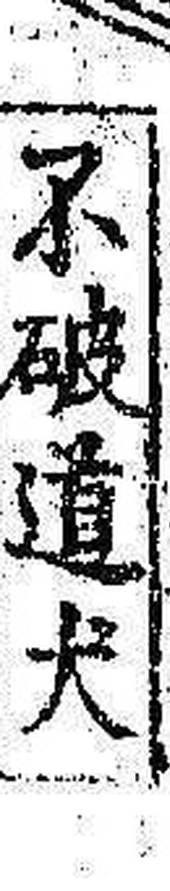不破道犬
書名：昔話稲妻表紙
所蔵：国文学研究資料館
